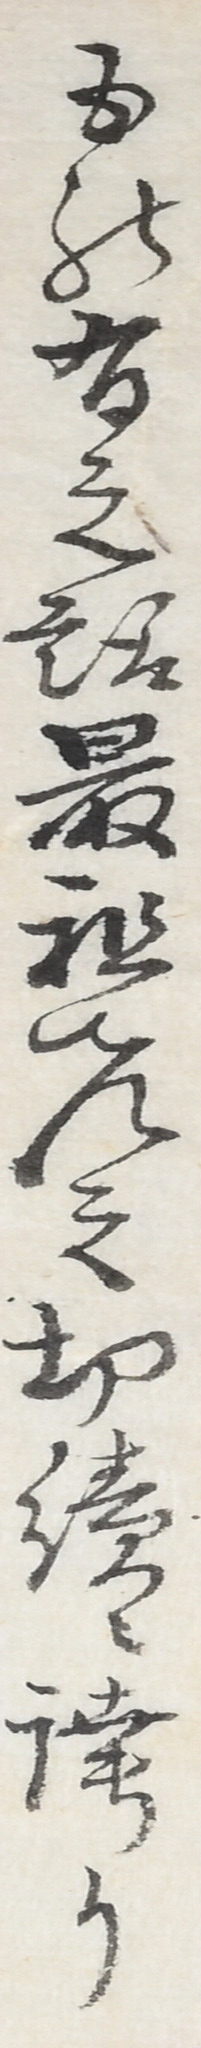もの有之趣最祖先之切続ニ誇り
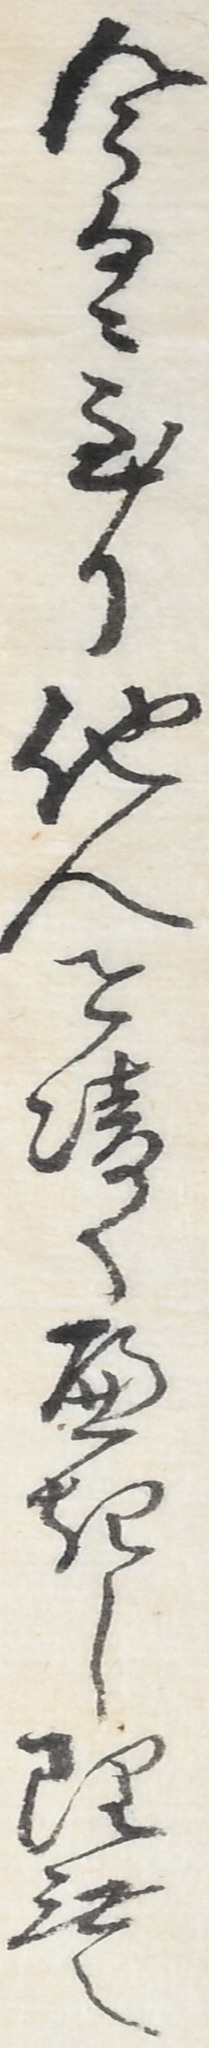今日に至り他人を凌くへきし理無之

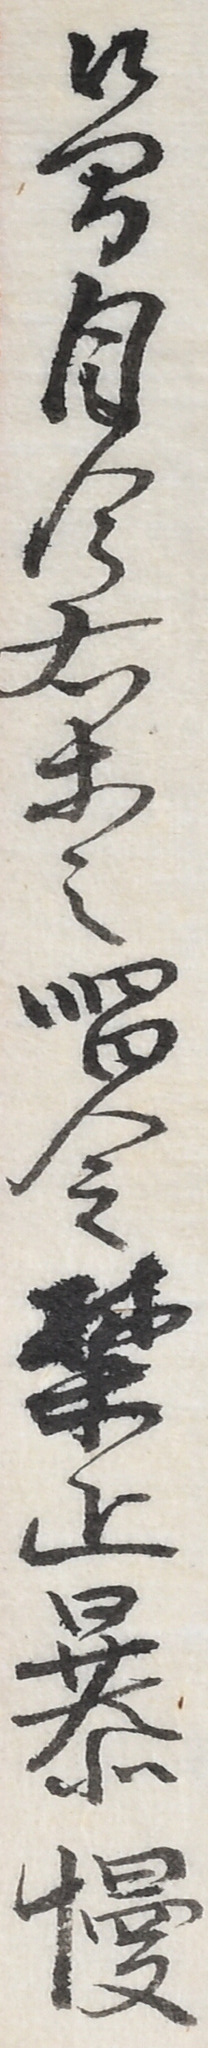候間自今右等之唱令禁止暴慢
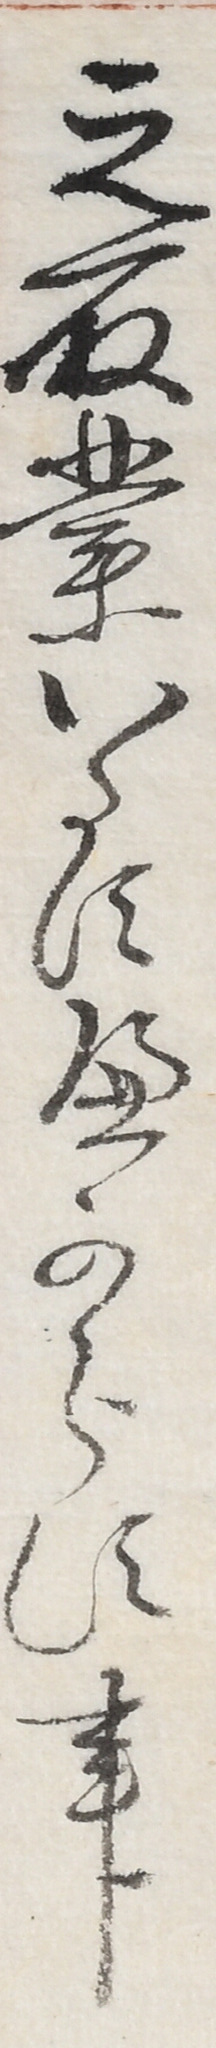之取業いたすへからす事
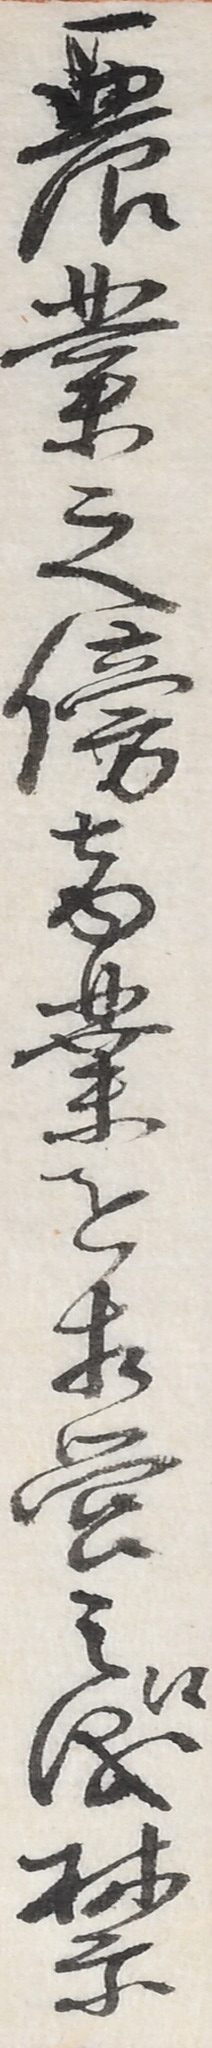一農業之傍商業を相営み候儀禁
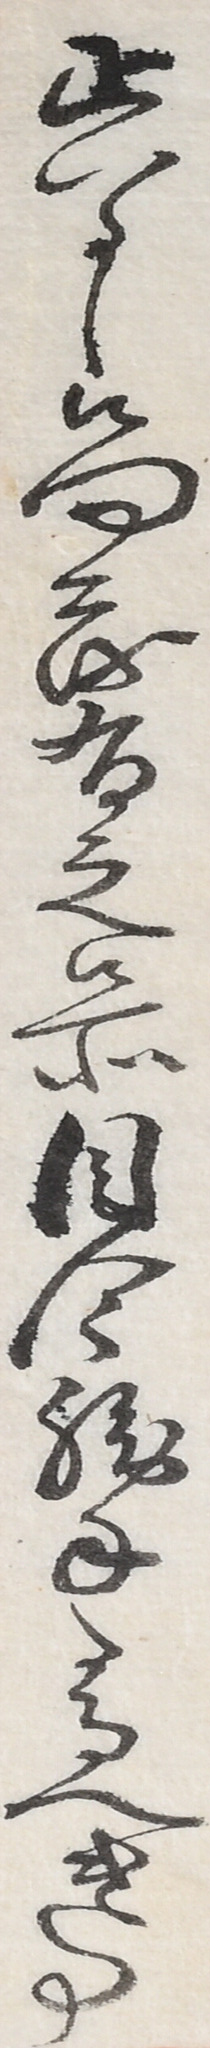此いたし候向も有之候所目今勝手たるへき事
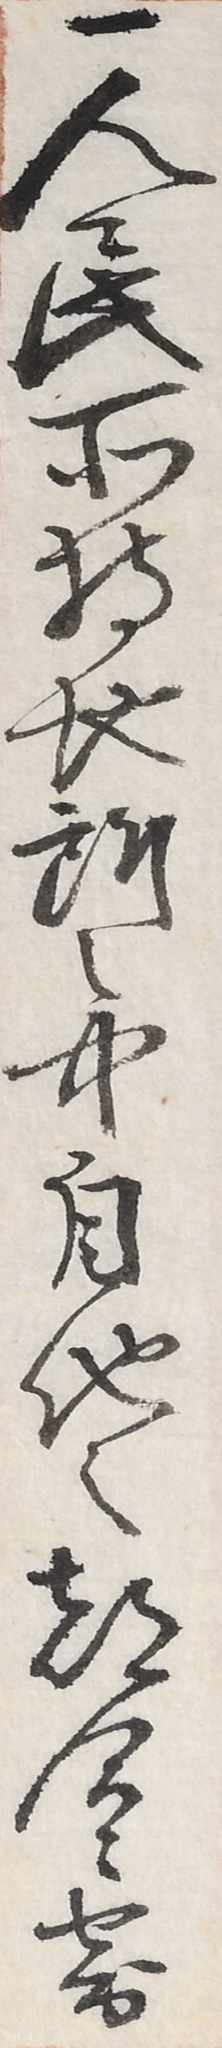一人民所持地所之中自他之都合に寄
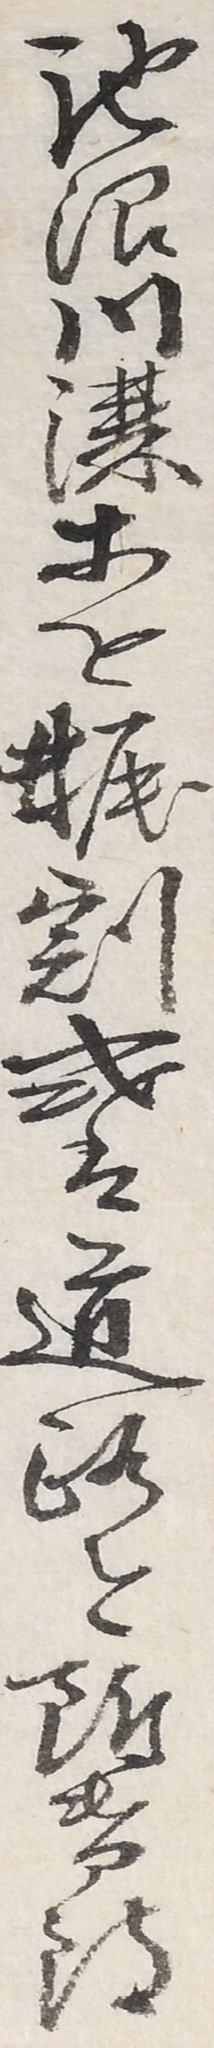池沼川溝等を掘割或は道路を附替致
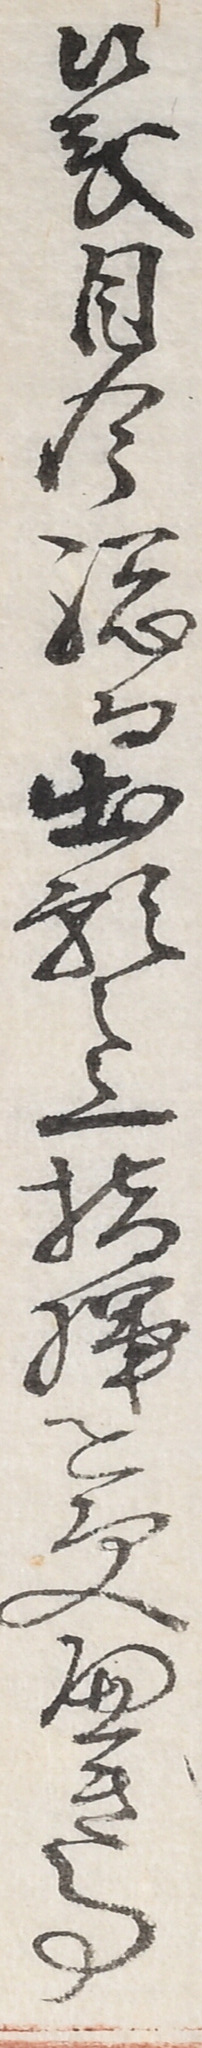候義目今総て出願之上指揮を受へき事
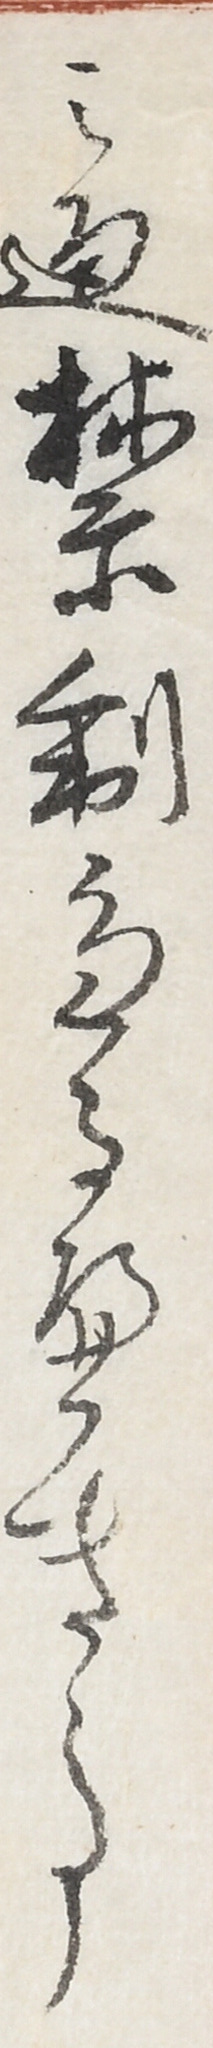之通禁制たるへき事
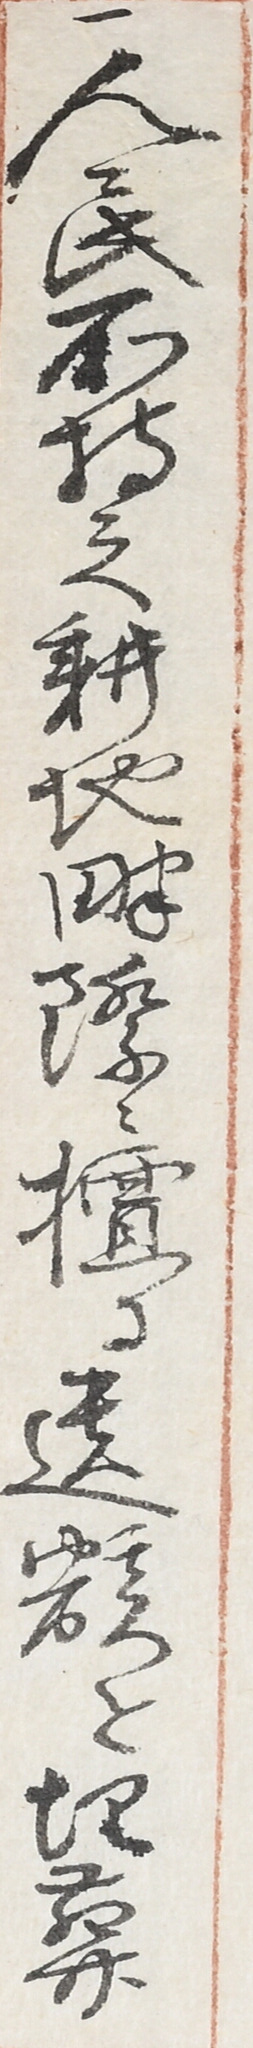一人民所持之耕地畔際に擅に遺骸を埋葬
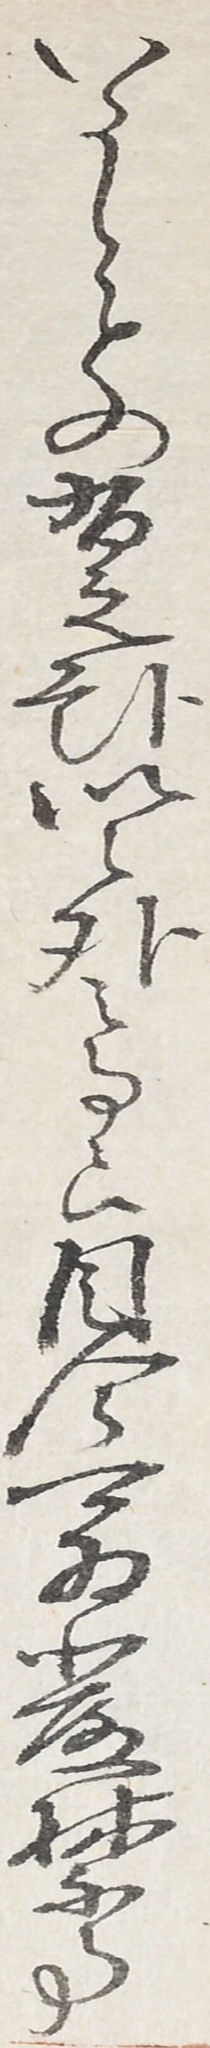いたしことの有之赴以之外之事ニ候目今可為厳禁事
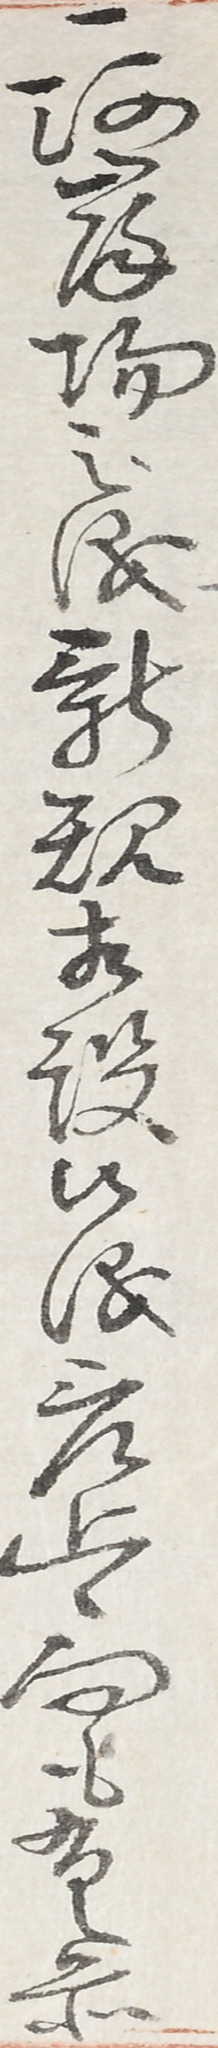一河岸場之儀新規相設候儀差止候向も有之候所
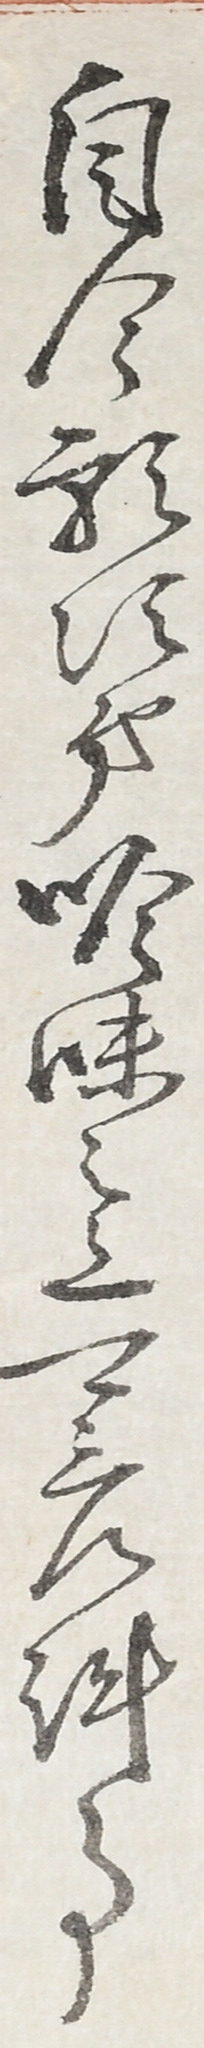自今願次第吟味之上可差許事
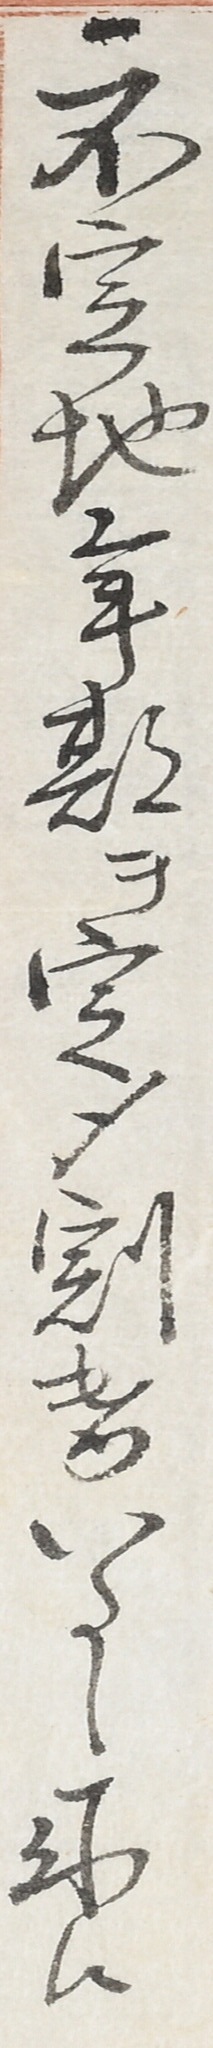一不定地年期を定め割替いたし来候
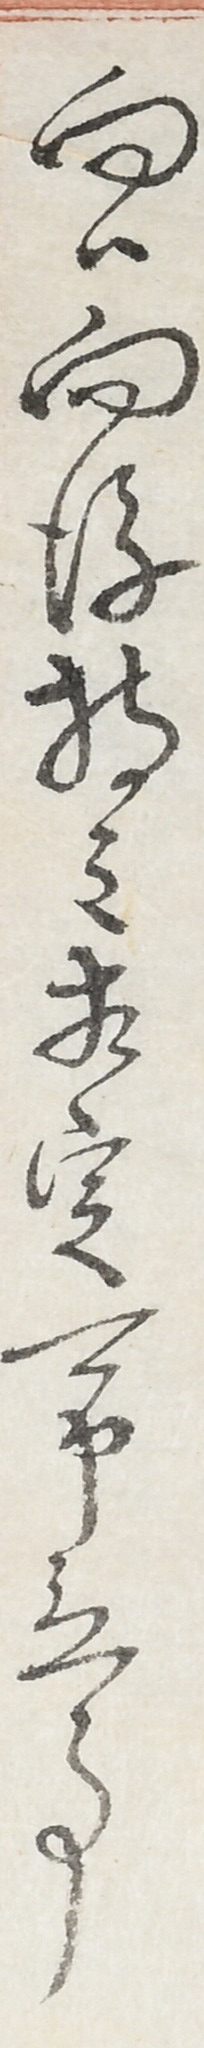向は向後持主相定可申立事
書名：壹番・御布告一式
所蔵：伊那市立高遠町図書館・合同会社AMANE
